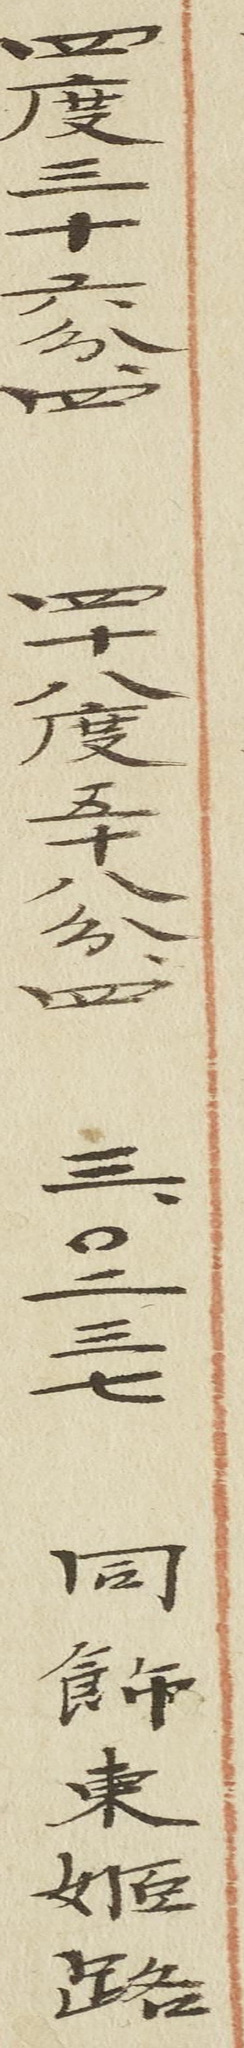四度三十六分、四四十八度五十八分、四三、〇二三七同飾東姫路
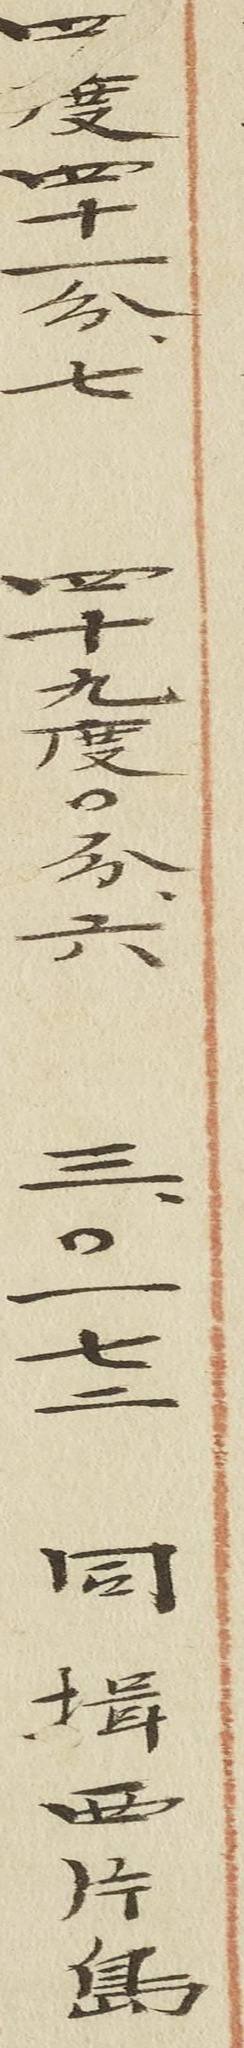四度四十一分、七四十九度〇分、六三、〇一七二同西揖片島
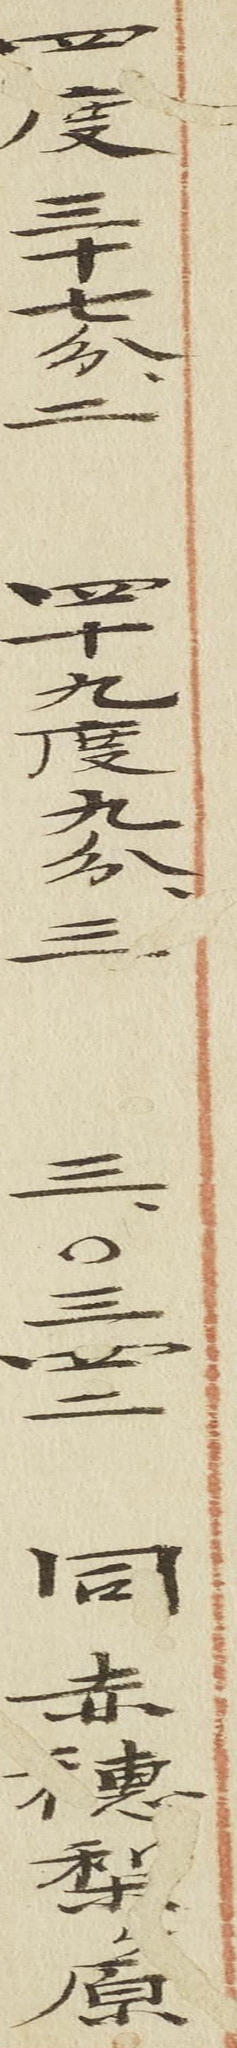四度三十七分、二四十九度九分、三三、〇三四二同赤穂梨ヶ原
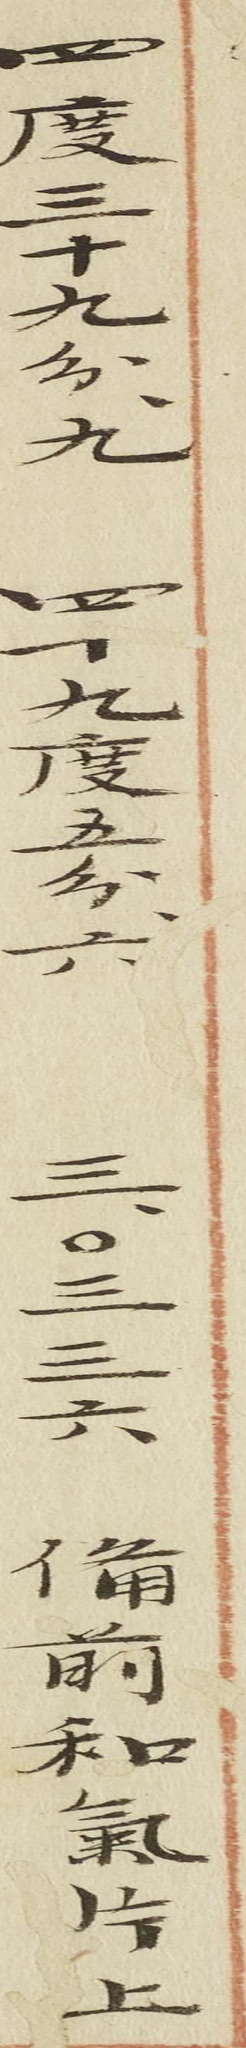四度三十九分、九四十九度五分、六三、〇三三六備前和気片上
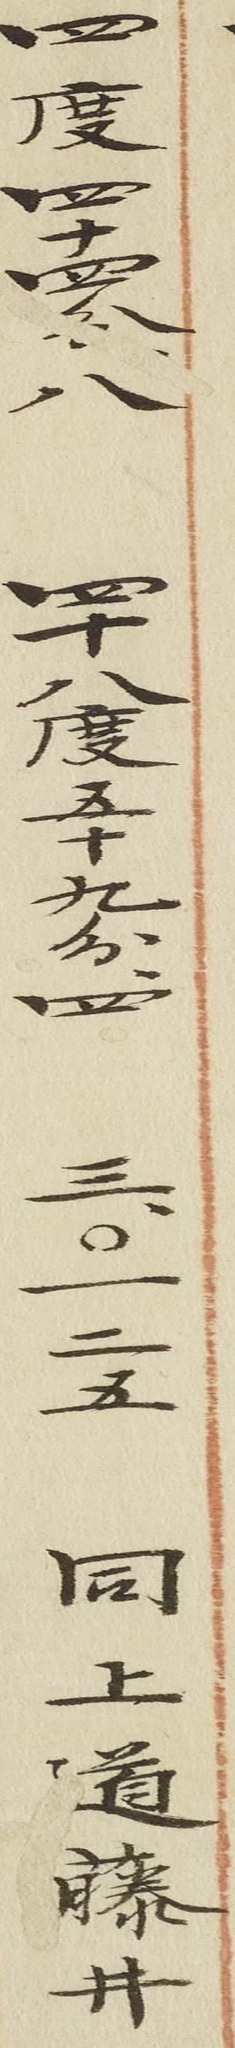四度四十四分、八四十八度五十九分、四三、〇一二五同上道藤井
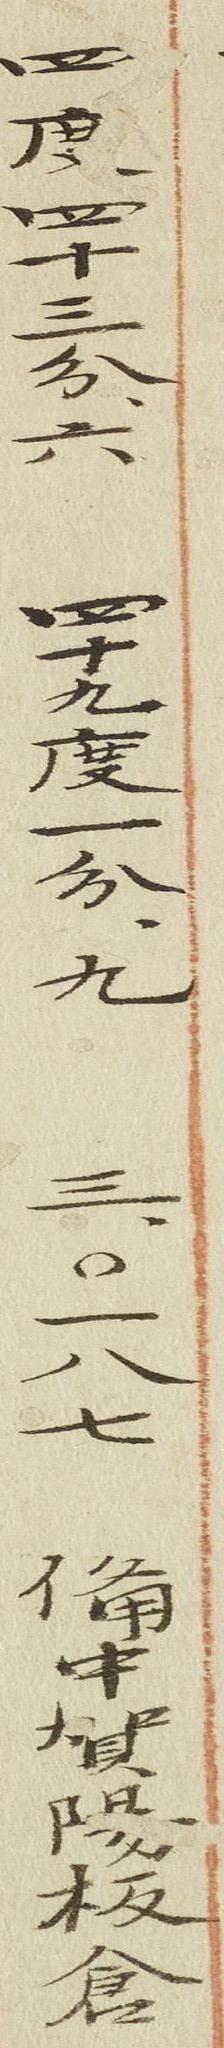四度四十三分、六四十九度一分、九三、〇一八七備中賀陽板倉
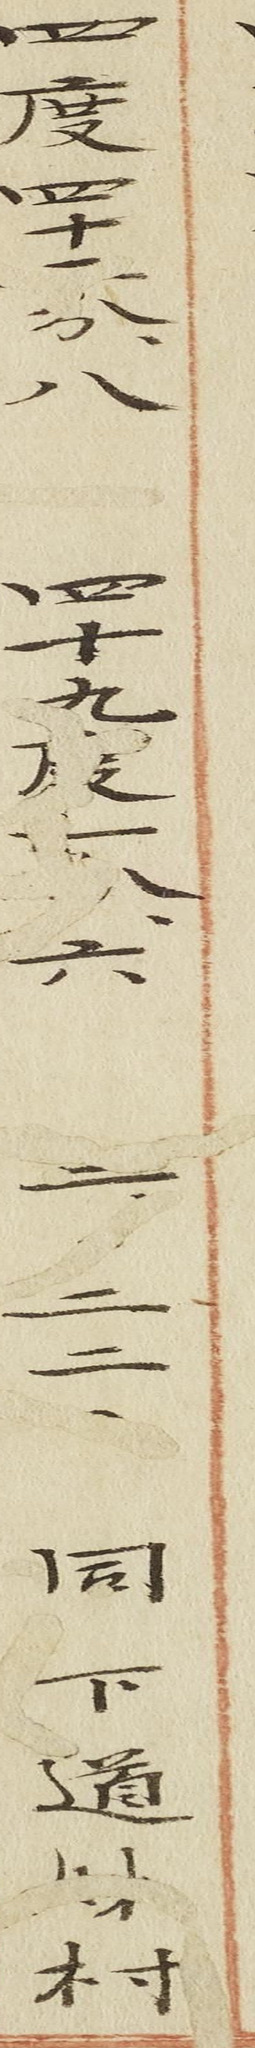四度四十二分、八四十九度一分、六、〇二二〇同下道妹村
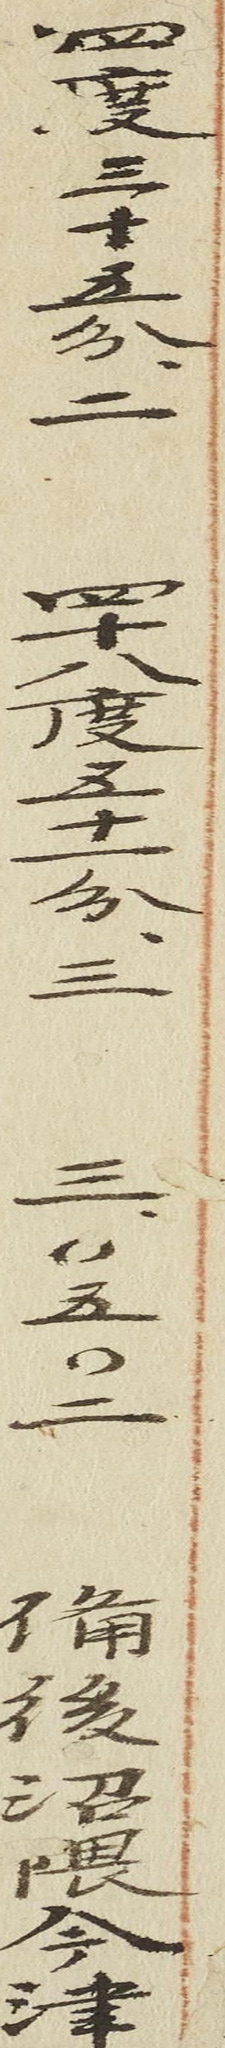四度三十五分、二四十八度五十一分、三三、〇五〇二備後沼隈今津
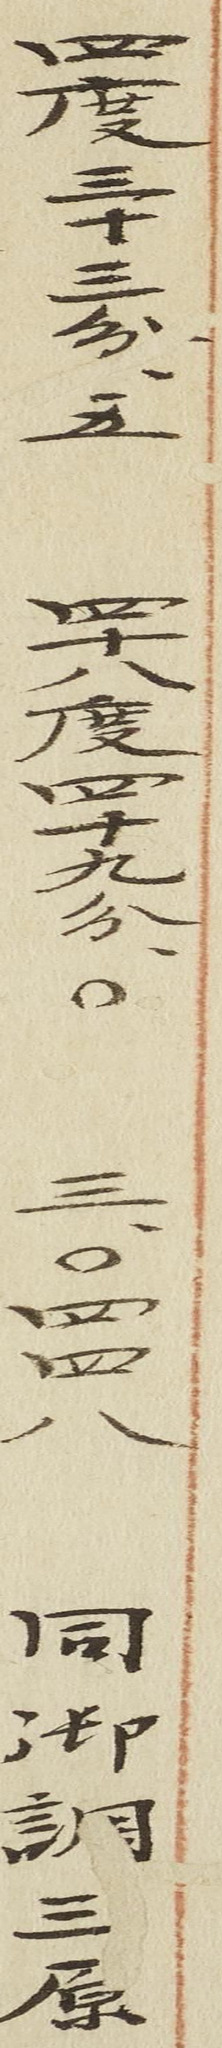四度三十三分、五四十八度四十九分、〇三、〇四四八同御調三原
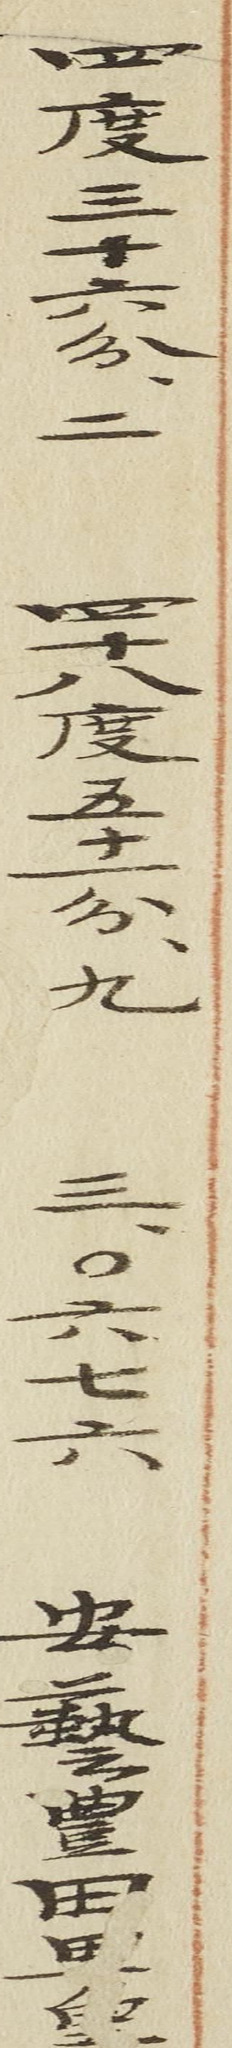四度三十六分、二四十八度五十一分、九三、〇六七六安芸豊田田万里
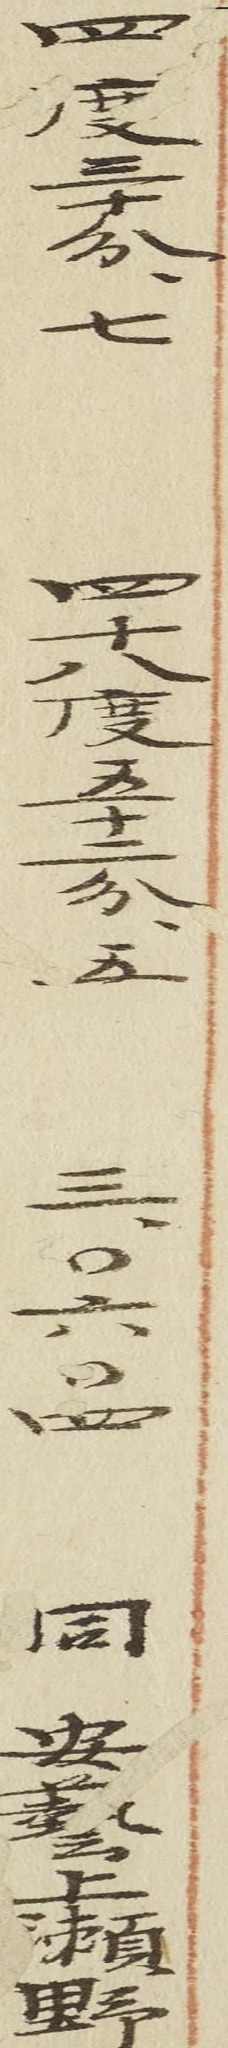四度三十分、七四十八度五十二分、五三、〇六〇四同安芸上瀬野
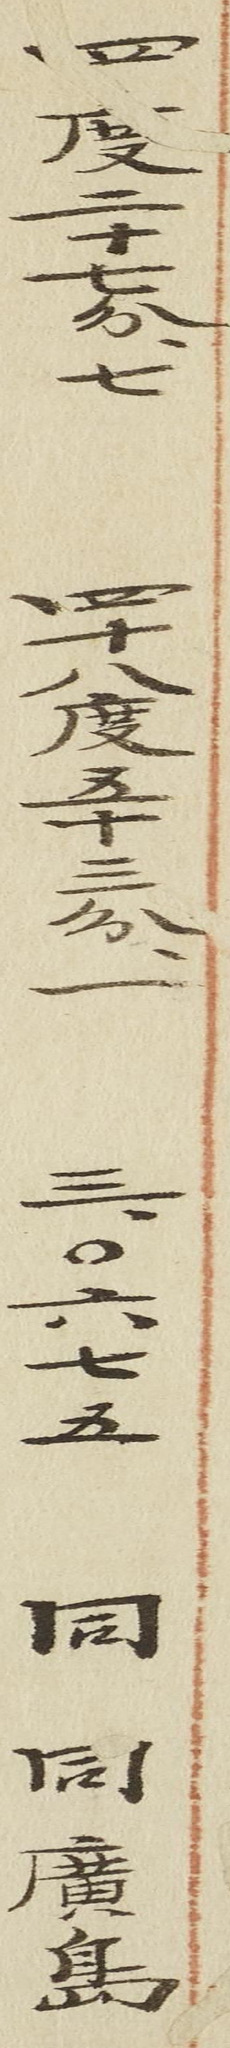四度二十七分、七四十八度五十三分、一三、〇六七五同同広島
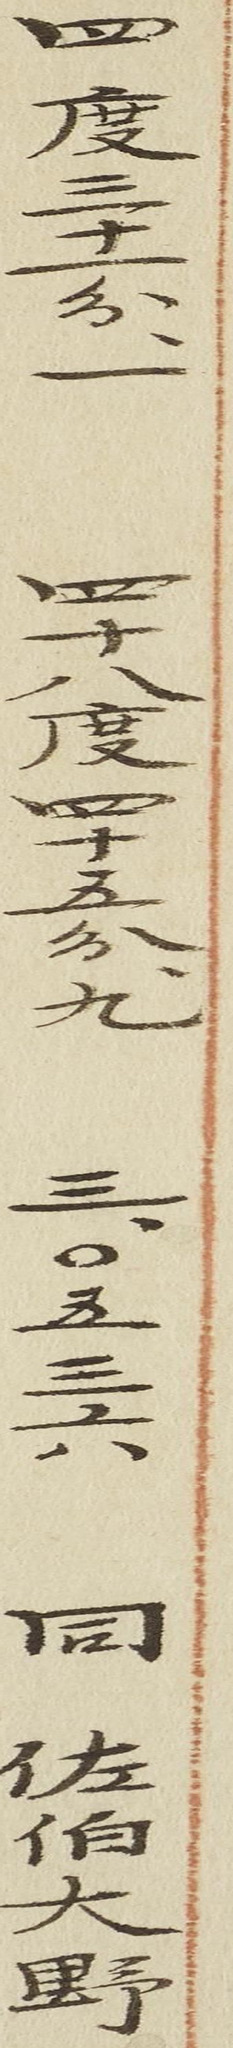四度三十一分、一四十八度四十五分、九三、〇五三六同佐伯大野
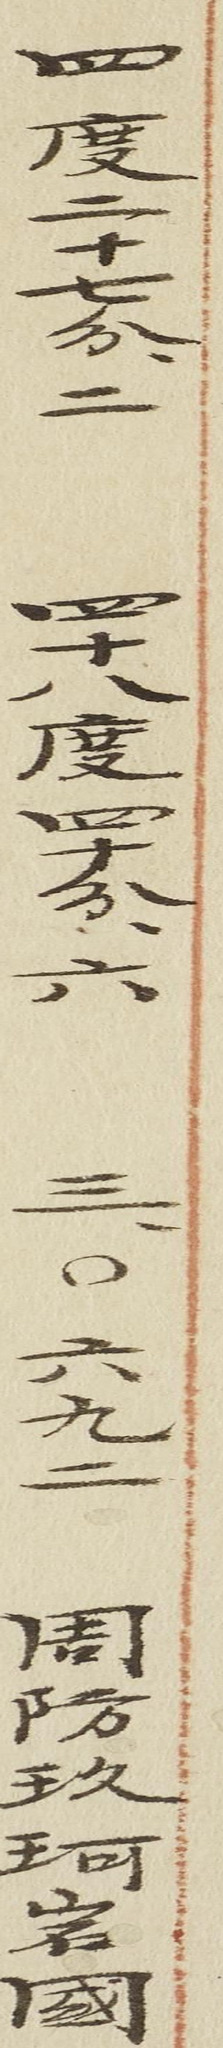四度二十七分、二四十八度四十分、六三、〇六九二周防玖珂岩国
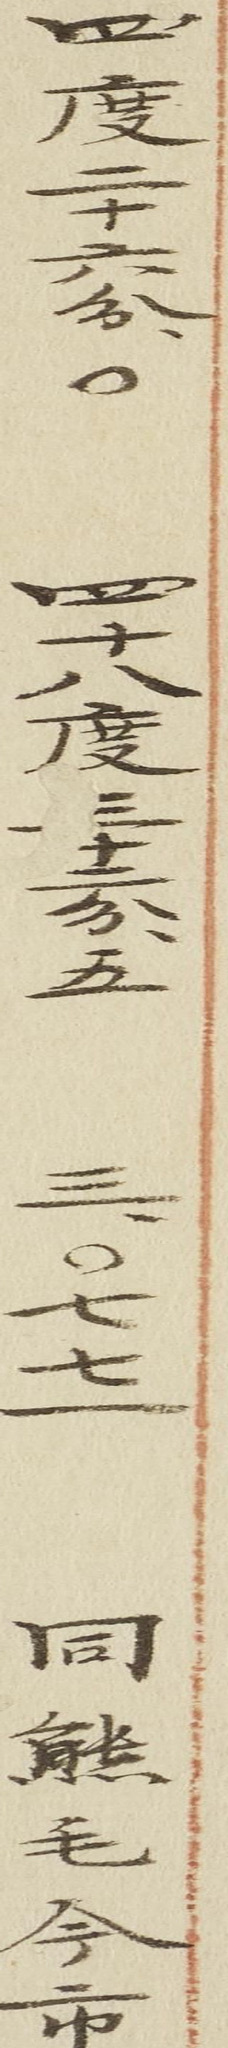四度二十六分、〇四十八度三十二分、五三、〇七七一同熊毛今市
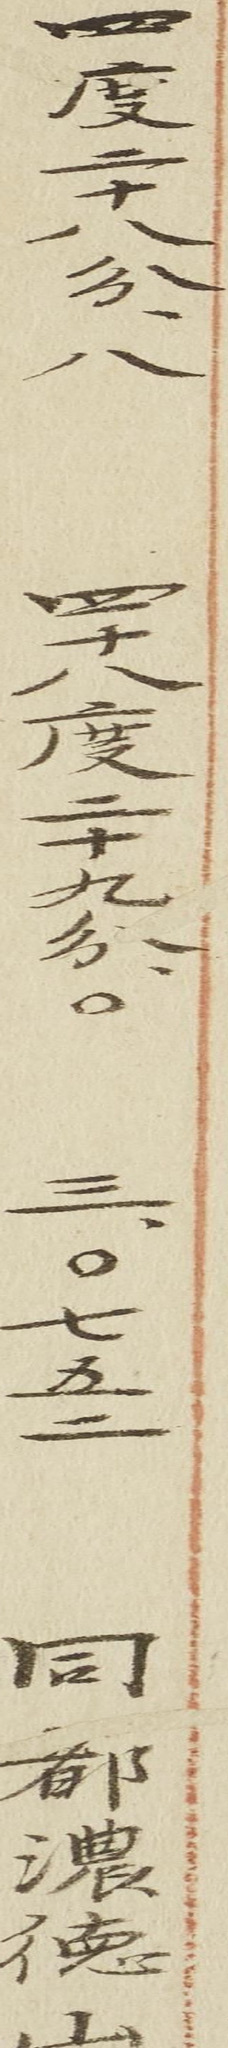四度二十八分、八四十八度二十九分、〇三、〇七五二同都濃徳山
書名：鑷力観測報告
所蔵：東京大学地震研究所図書室 Earthquake Research Institute Library, The University of Tokyo, JAPAN
